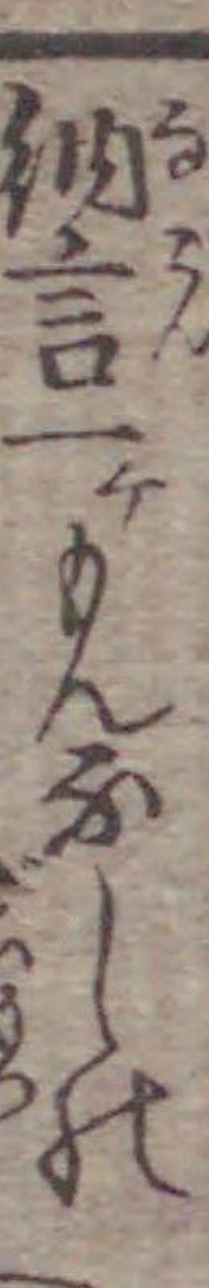納言一ヶもんなしの
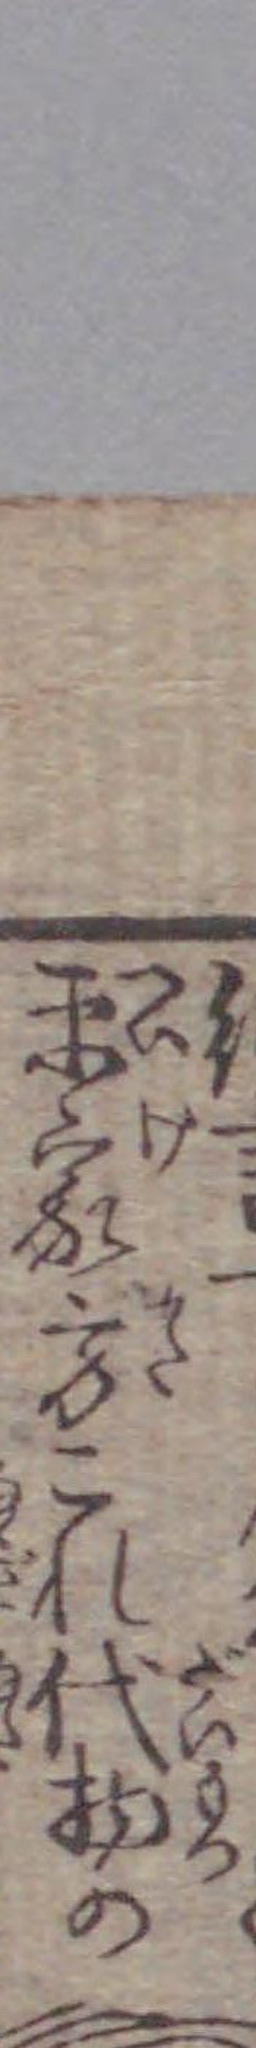平家方これ代物の
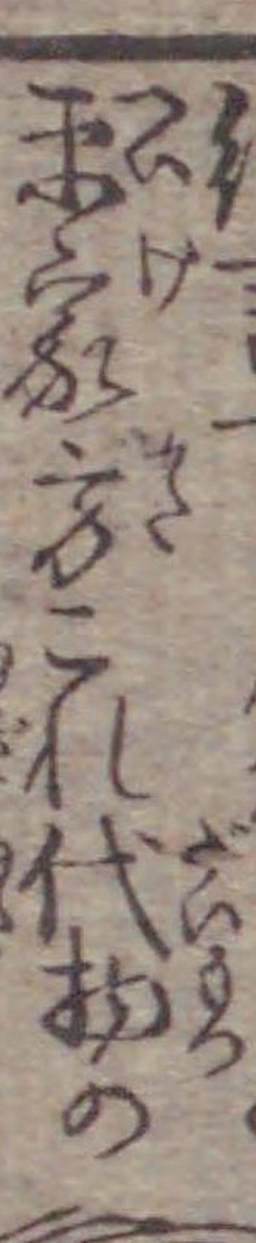平家方これ代物の
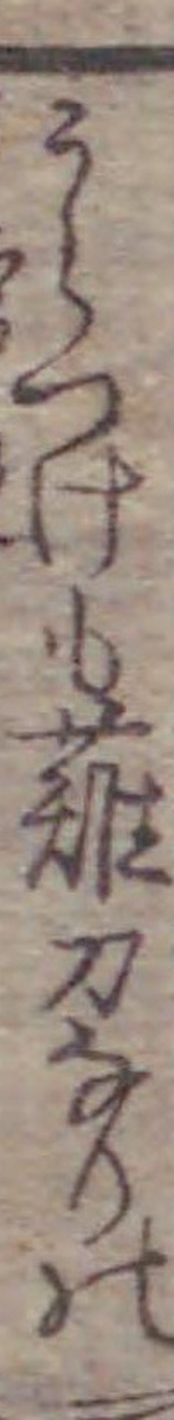うらづけも薙刀なりの
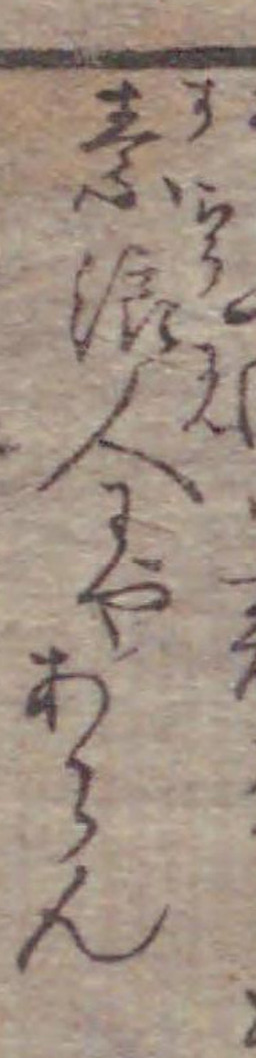素浪人にやあらん

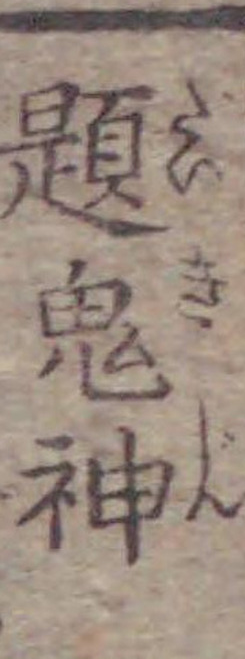題鬼神
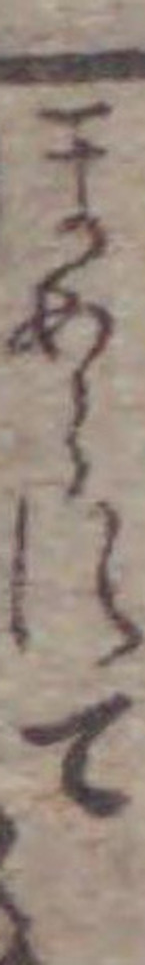ほめられて
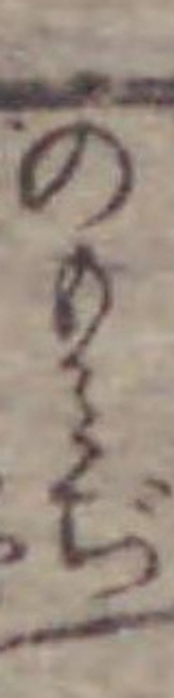のもみぢ
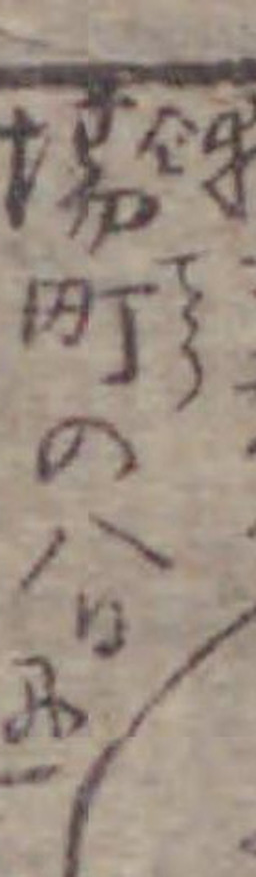場町の八日に
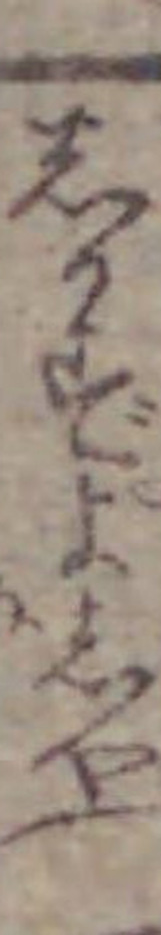しかず。よしや
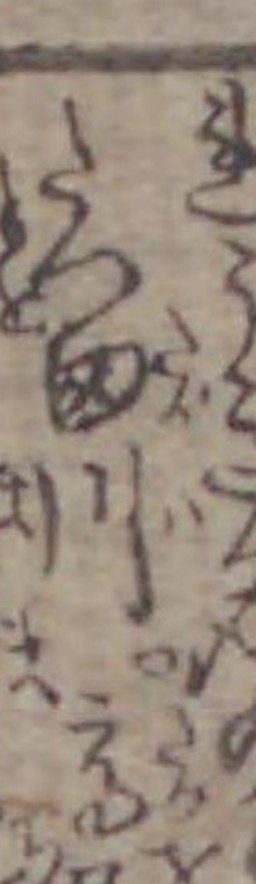たつ田川。高尾
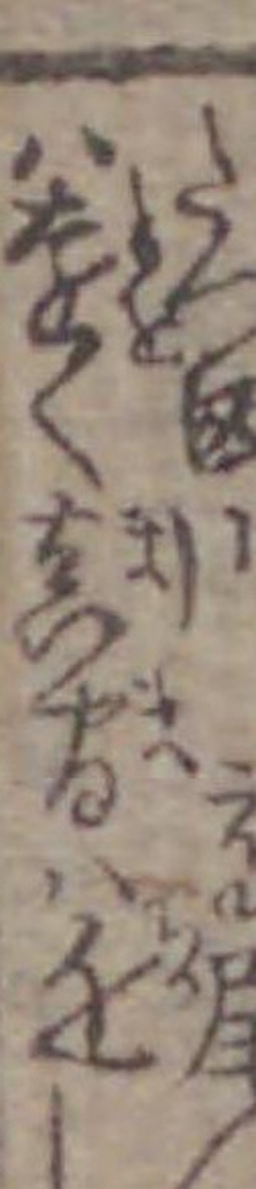は遠く真間は近し
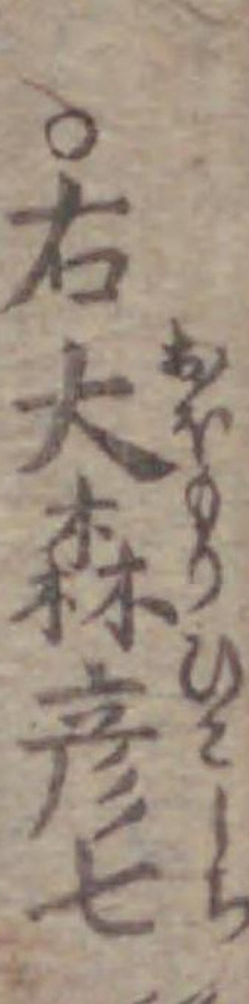○右大森彦七
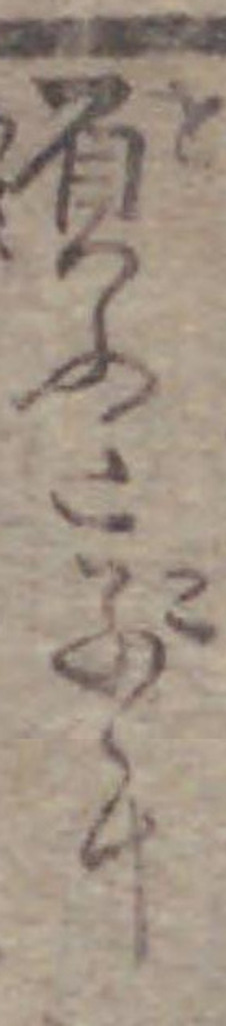負ふた子に
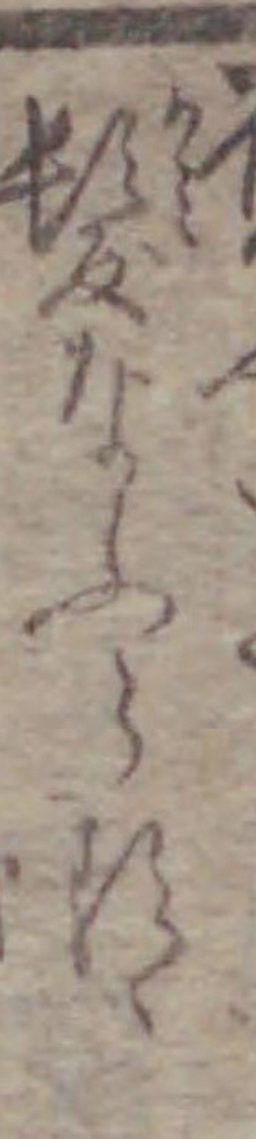髪なふらるゝ
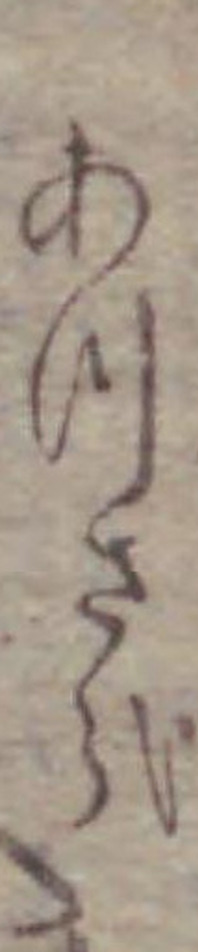あつさ哉
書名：武者合天狗俳諧 : 2巻
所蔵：国立国会図書館 National Diet Library, JAPAN
